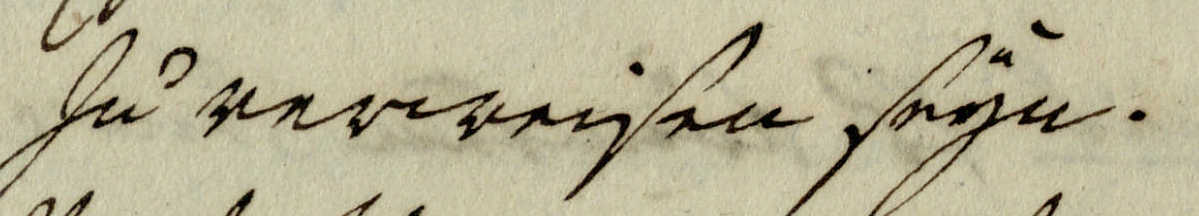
zu verweisen seÿn.
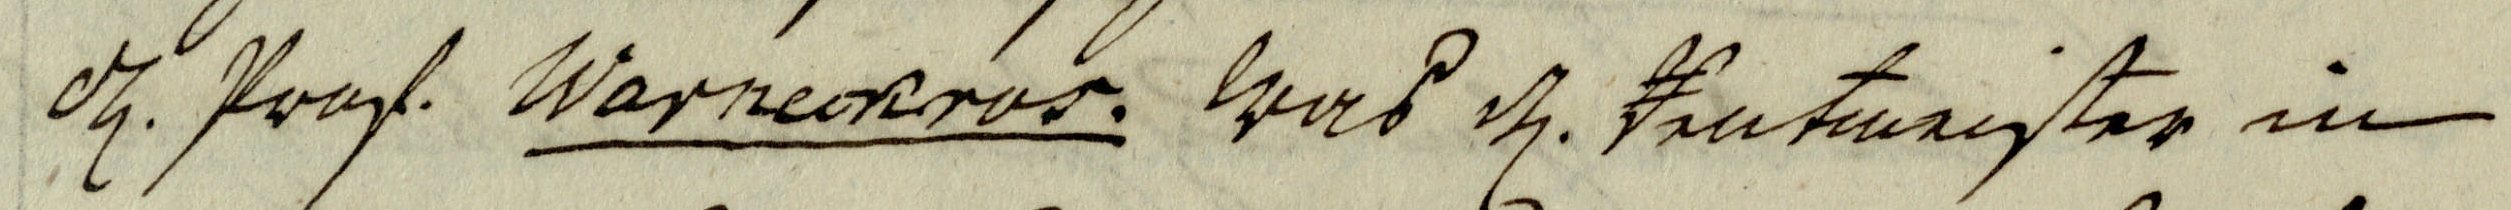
dh. Prof. Warneckros. was dh. Rentmeister in
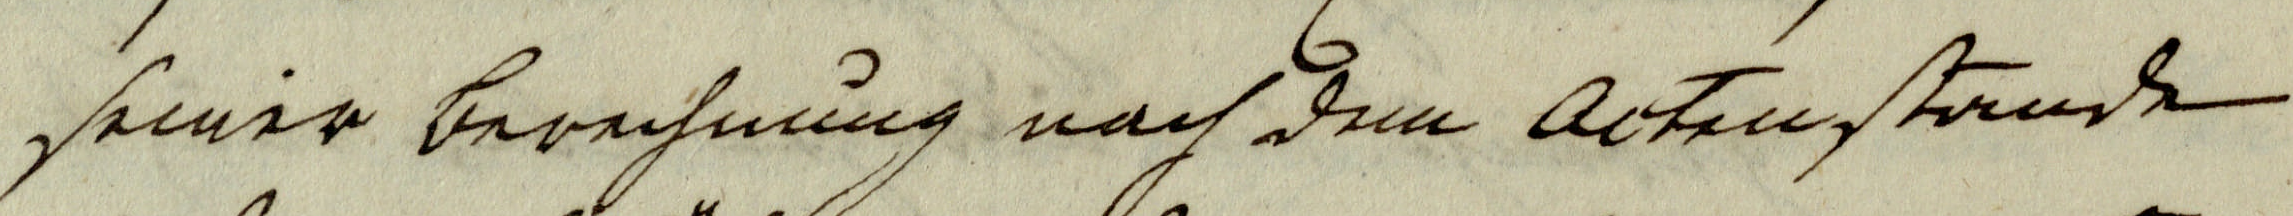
seiner Berechnung nach dem Actenstande
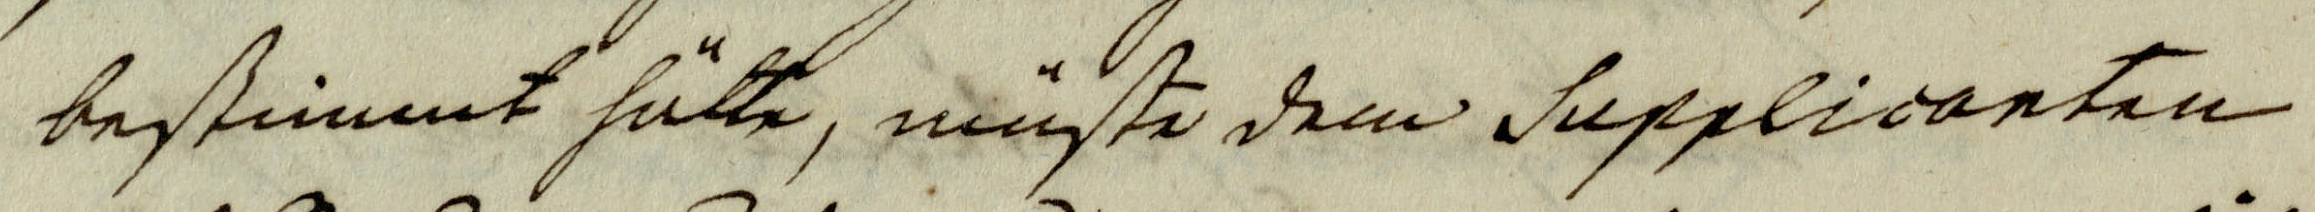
bestimmt hätte, müsste dem Supplicanten
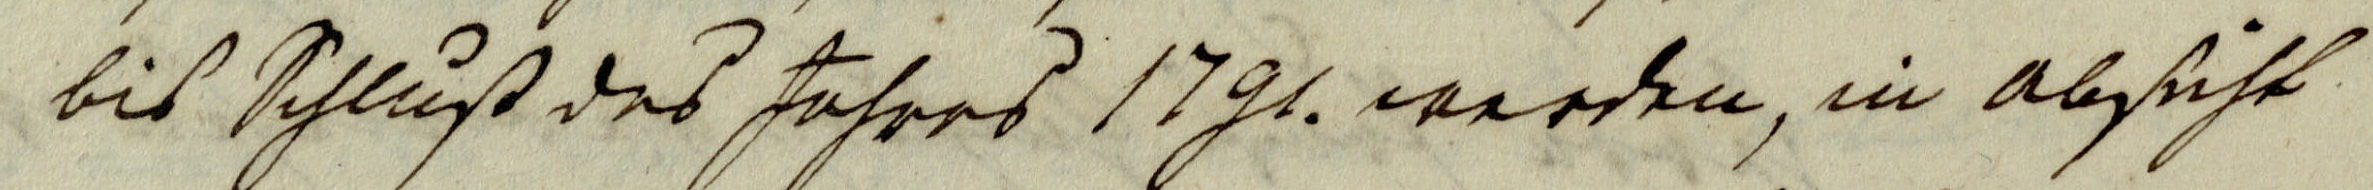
bis Schluß des Jahres 1791. werden, in Absicht
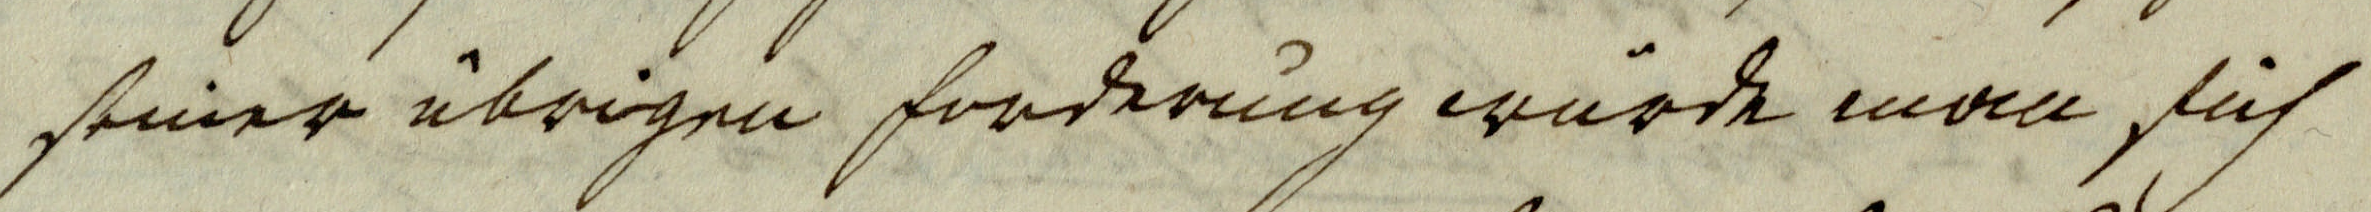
seiner übrigen Forderung würde man sich
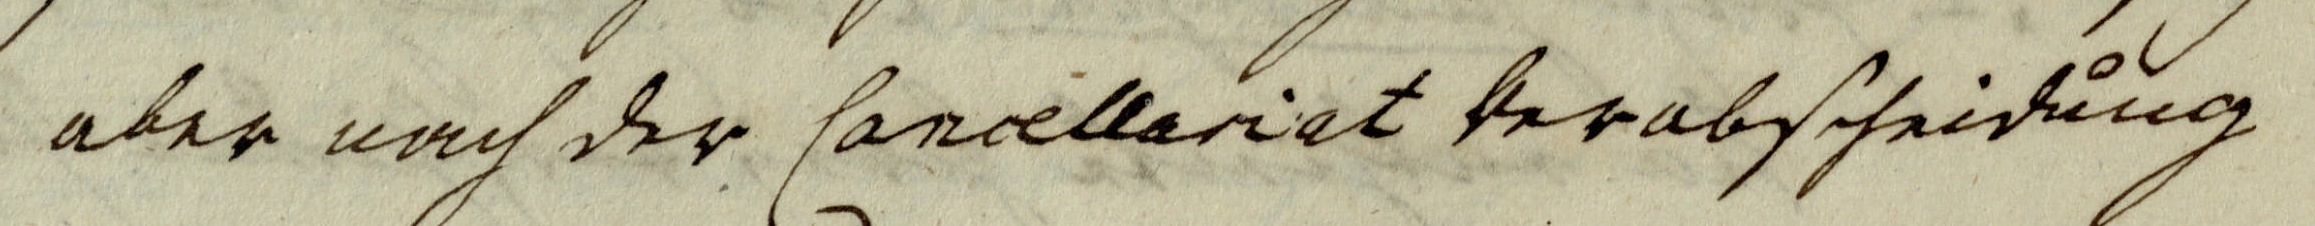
aber nach der Cancellariat Verabschiedung
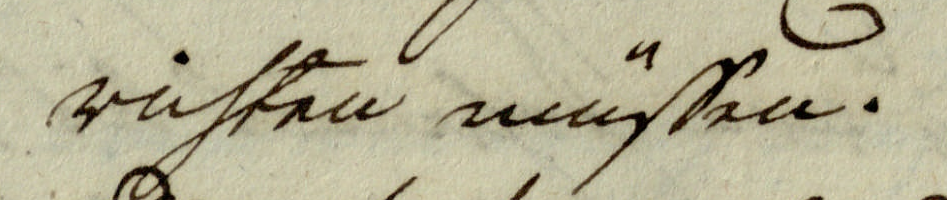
richten müssen.
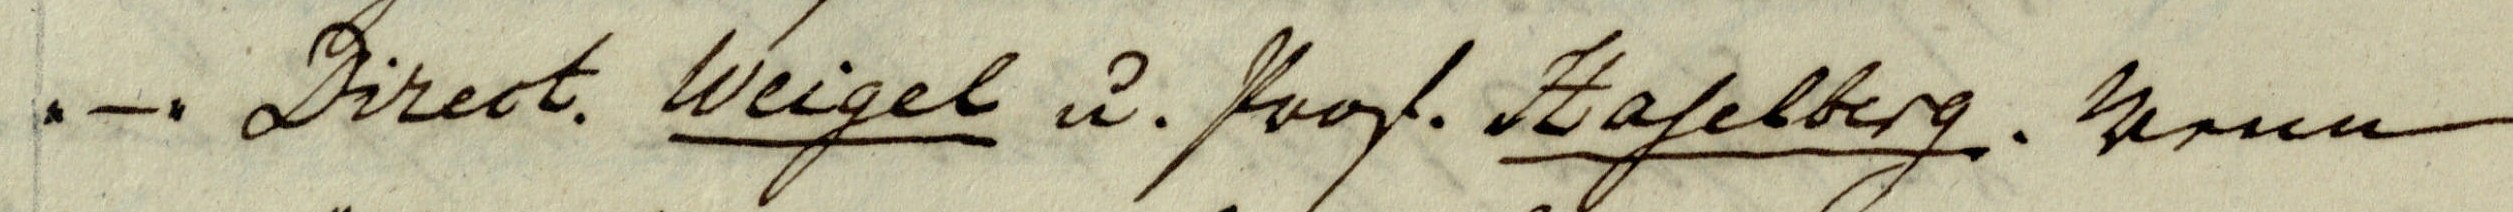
" — " Direct. Weigel u. Prof. Haselberg. Wenn
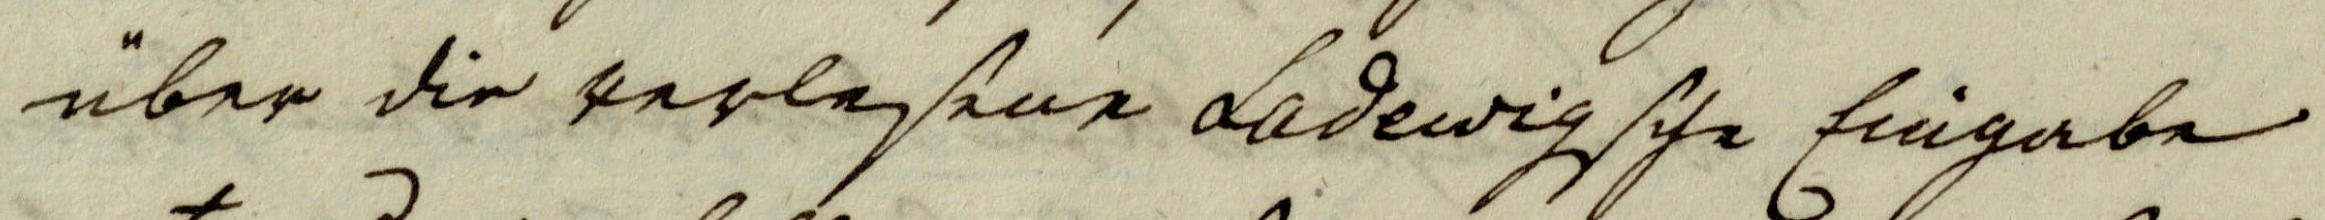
über die verlesene Ladewigsche Eingabe
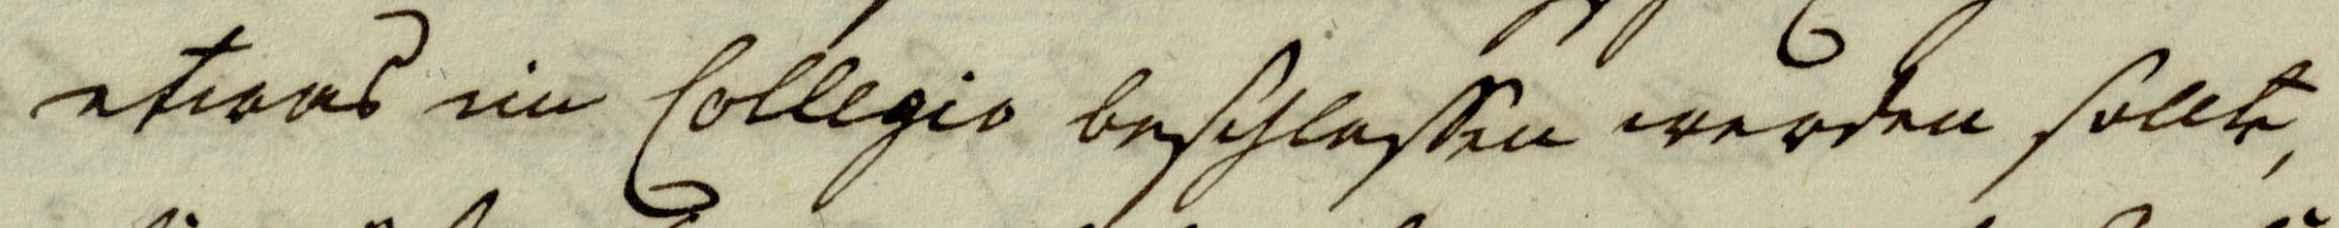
etwas im Collegio beschlossen werden sollte,
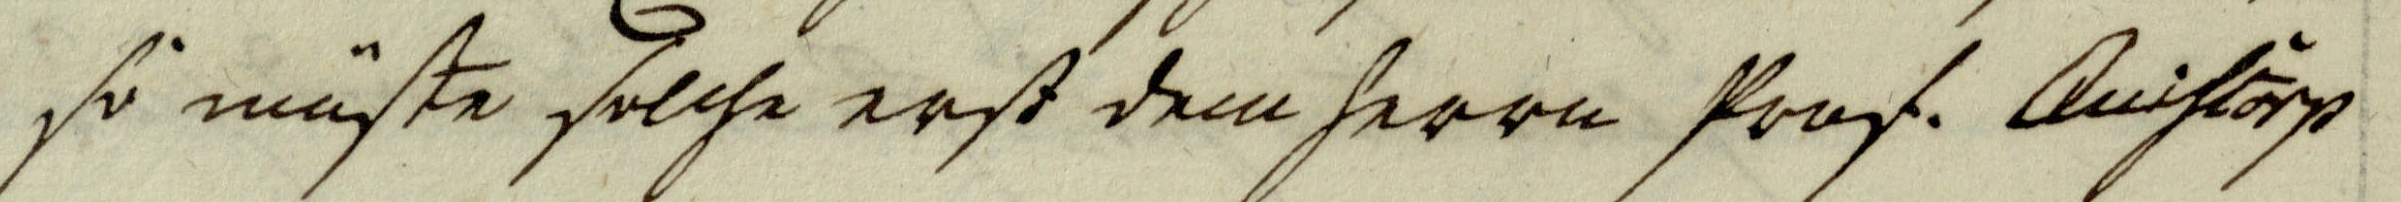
so müsste solche erst dem Herrn Prof. Quistorp
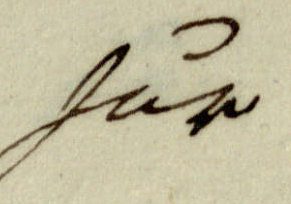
zur
